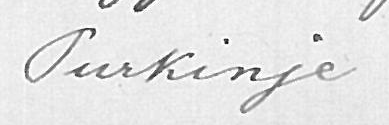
Purkinje
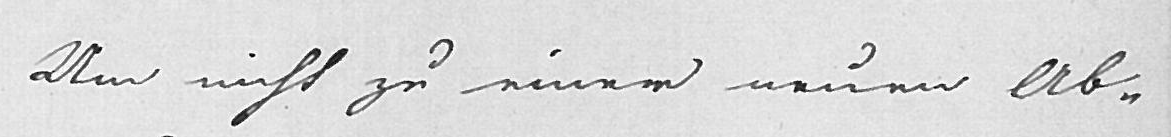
Um nicht zu einer neuen Ab-
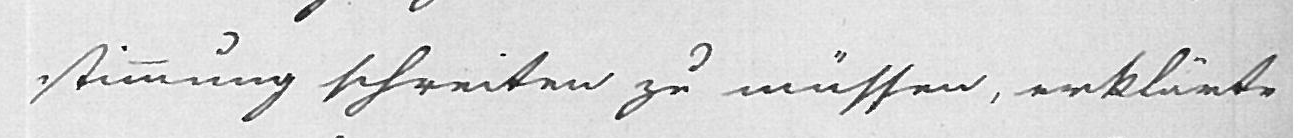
Stimmung schreiten zu müssen, erklärte
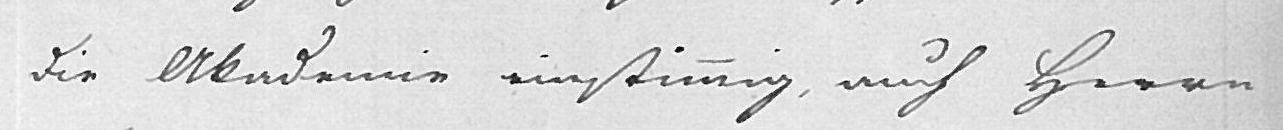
die Akademie einstimmig, auch Herrn
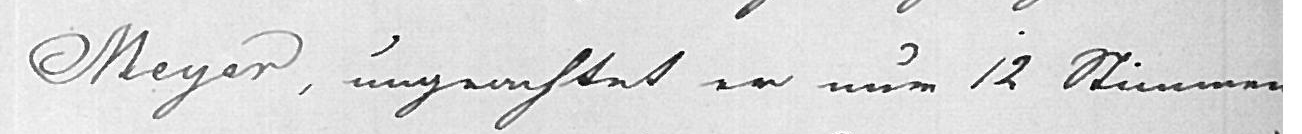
Meyer, ungeachtet er nur 12 Stimmen
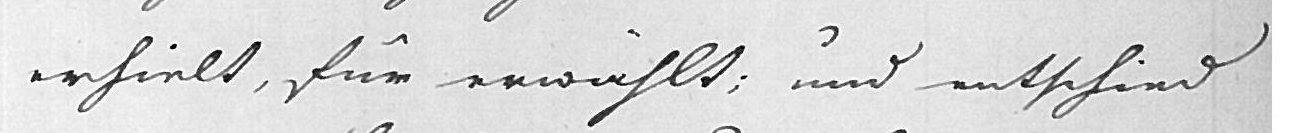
erhielt, für erwählt; und entschied
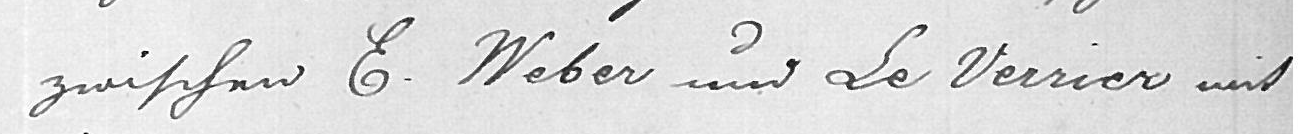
zwischen E. Weber und Le Verrier mit
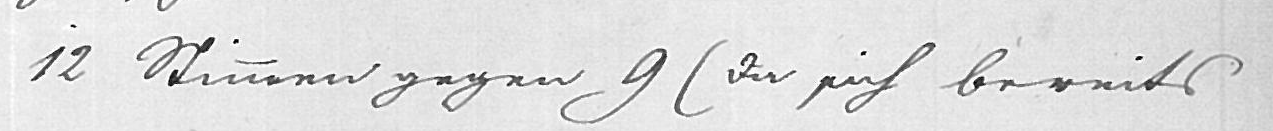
12 Stimmen gegen 9 (da sich bereits
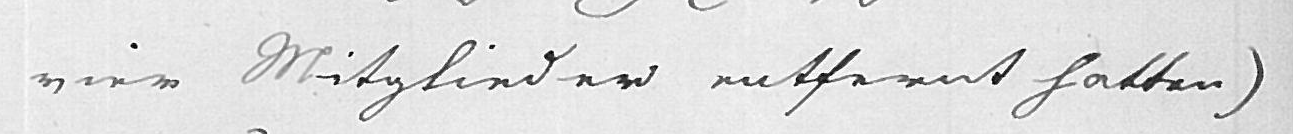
vier Mitglieder entfernt hatten)
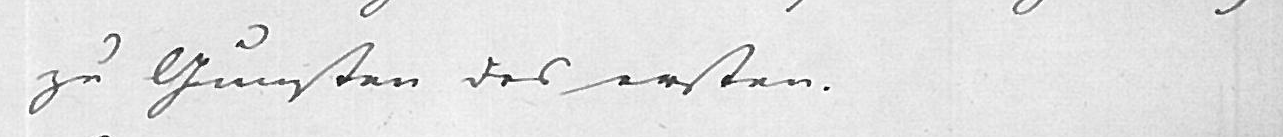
zu Gunsten des ersten.
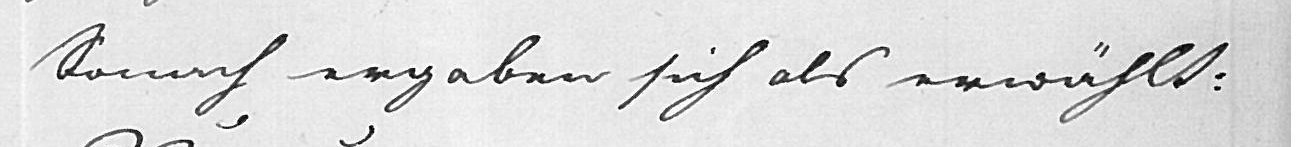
Sonach ergaben sich als erwählt:
